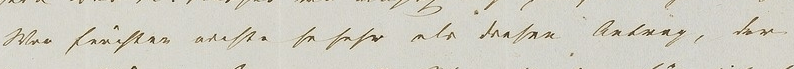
Wir fürchten nichts so sehr als diesen Antrag, der
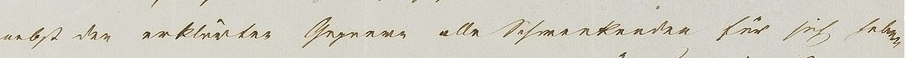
nebst den erklärten Gegnern alle Schwankenden für sich haben
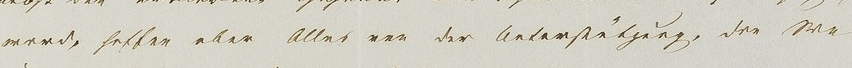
wird, hoffen aber Alles von der Unterstützung, die Sie
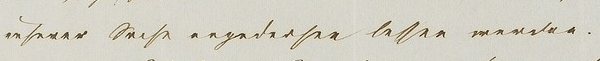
unserer Sache angedeihen lassen werden.
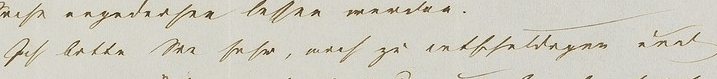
Ich bitte Sie sehr, mich zu entschuldigen und
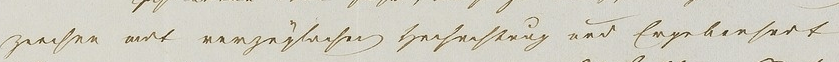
zeichne mit vorzüglicher Hochachtung und Ergebenheit
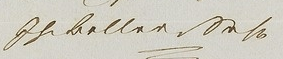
J. H. Boller Sohn
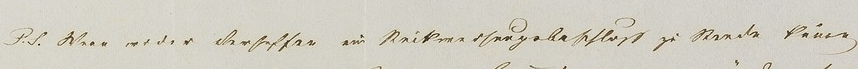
P. S. Wenn wider Verhoffen ein Rückweisungsbeschluß zu Stande käme,
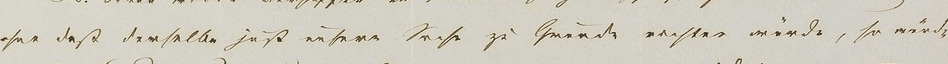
ohne daß derselbe just unsere Sache zu Grunde richten würde, so würde
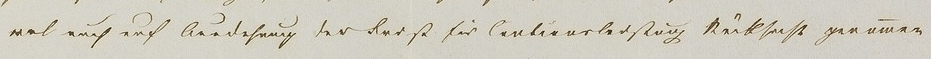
wol auch auf Ausdehnung der Frist für Cautionsleistung Rücksicht genommen
